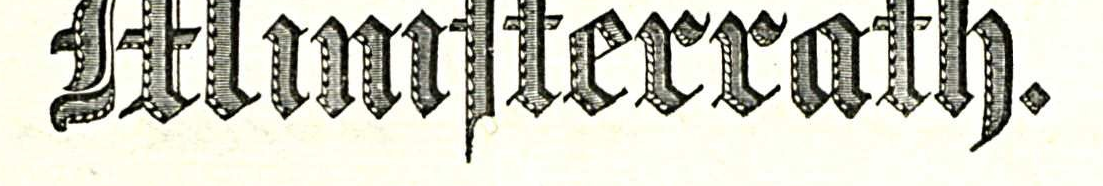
Ministerrath
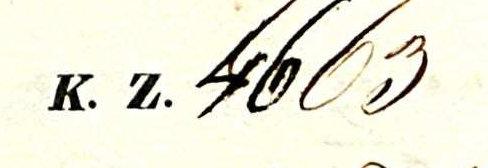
KZ 4663. 849
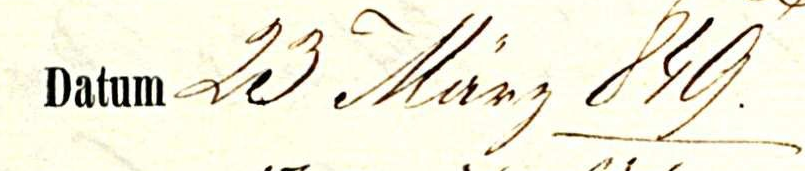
Datum 23. März 849
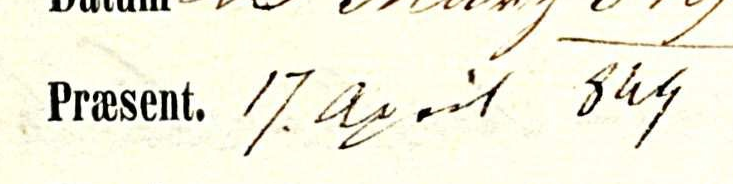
Praesent. 17. April 849
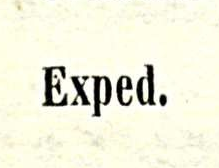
Exped.
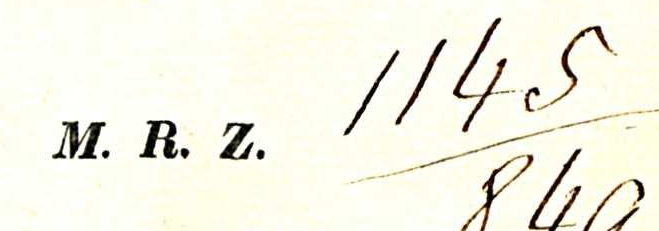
M.R. Z. 1145
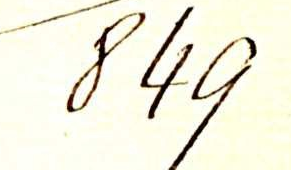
849
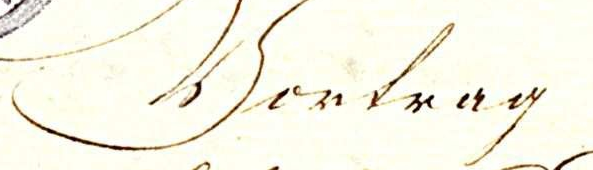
Vortrag
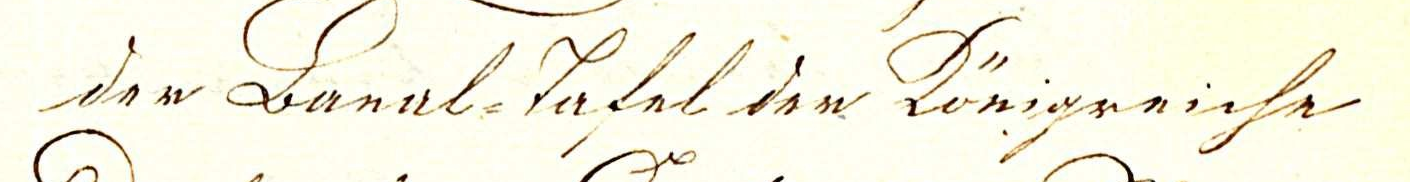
Der Banat-Tafel der Königreiche
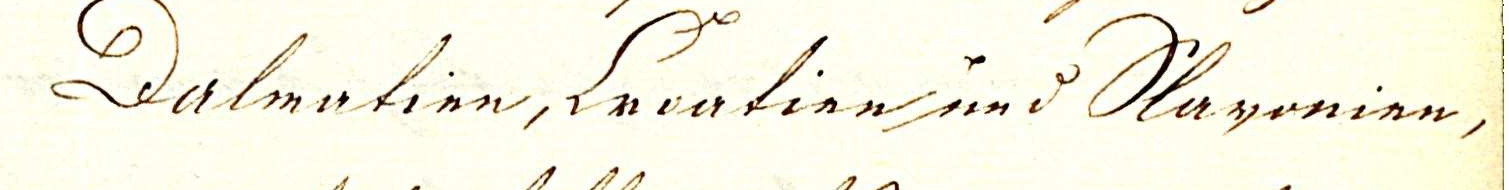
Dalmatien, Croatien und Slavonien,
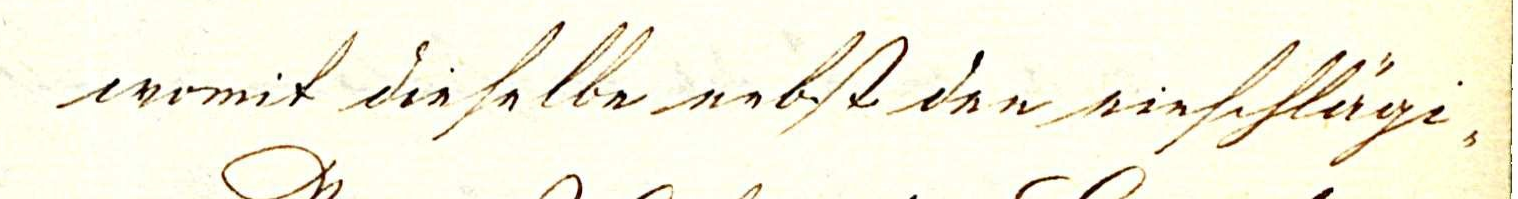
womit dieselbe nebst den einschlägi¬
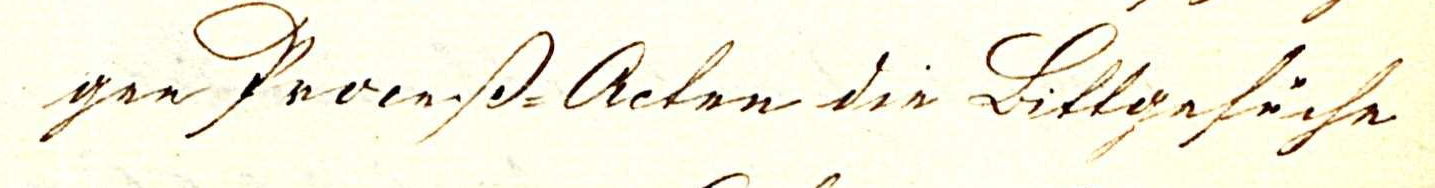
gen Proceß-Acten die Bittgesüche
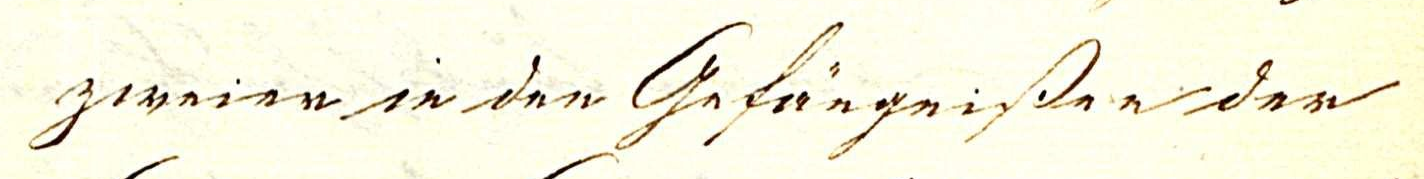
zweier in den Gefängnißen der
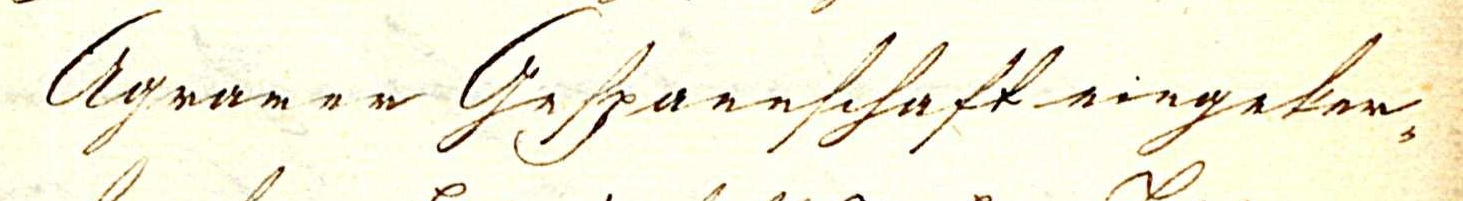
Agramer Gespannschafteingeker¬
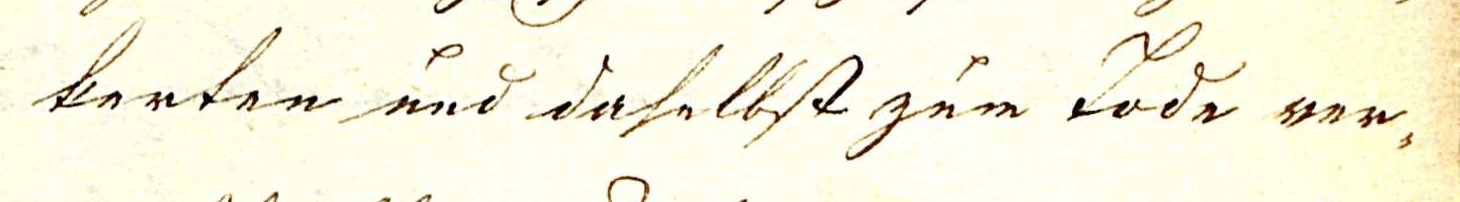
kerten und daselbst zum Tode ver¬
